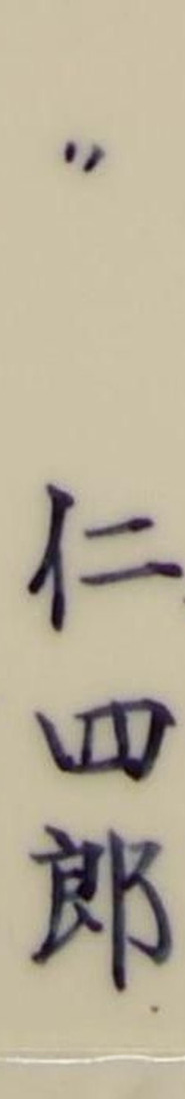仁四郎
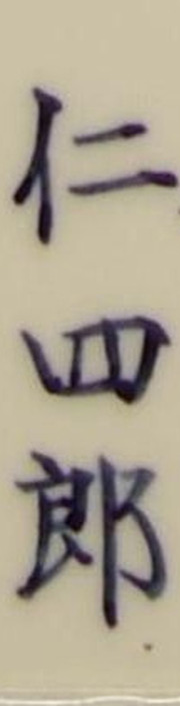仁四郎
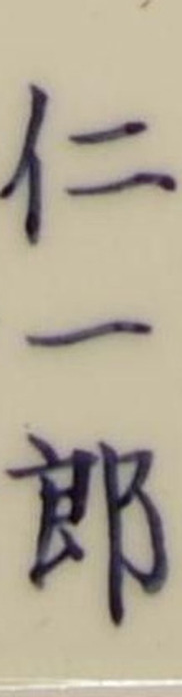仁一郎
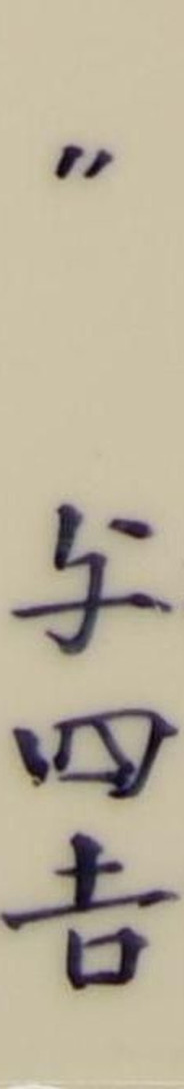与四吉
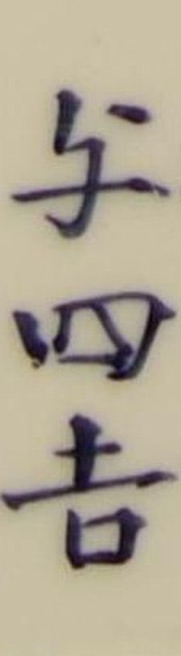与四吉
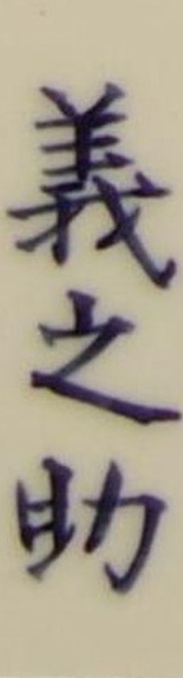義之助
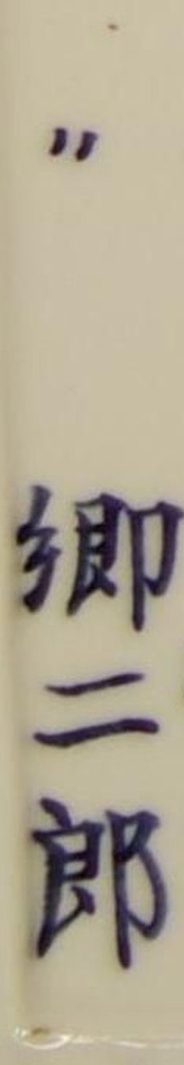郷二郎
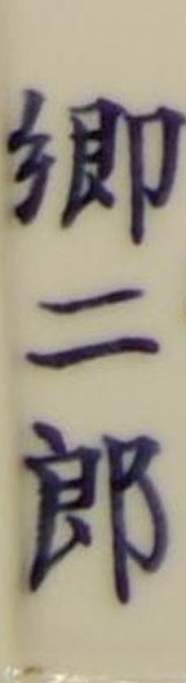郷二郎

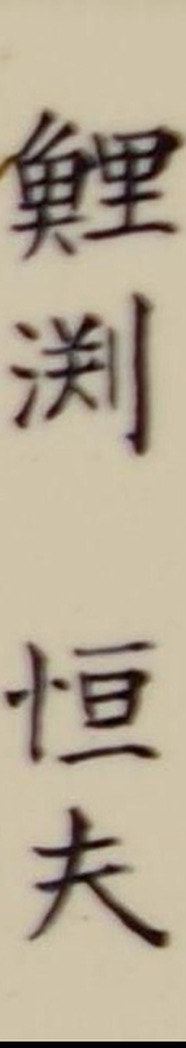鯉渕恒夫
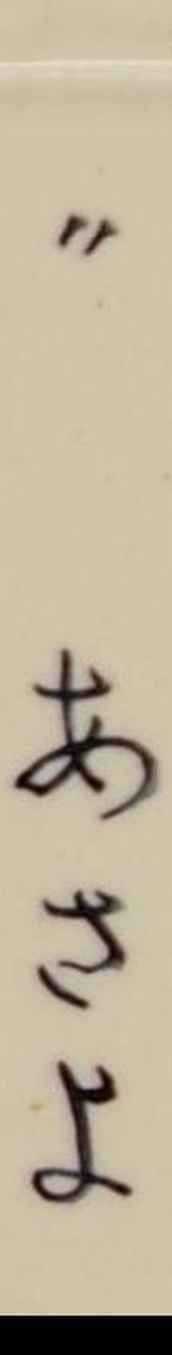あさよ
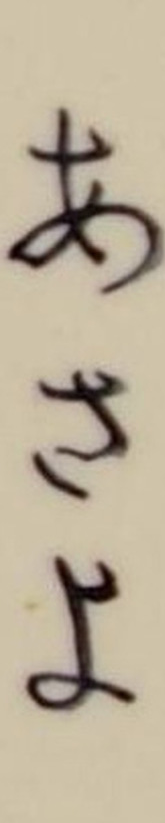あさよ
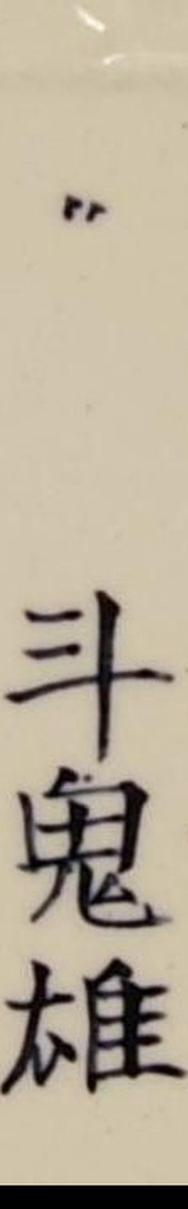斗鬼雄
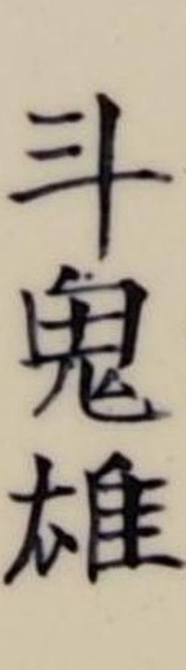斗鬼雄
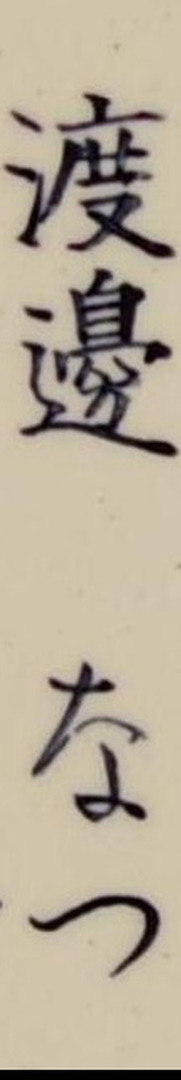渡辺なつ
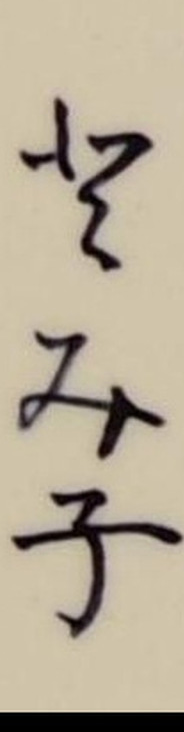とみ子
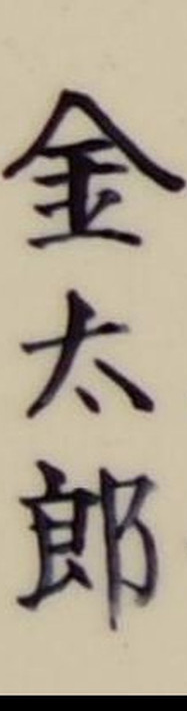金太郎
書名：E~L
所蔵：高野山金剛峯寺
